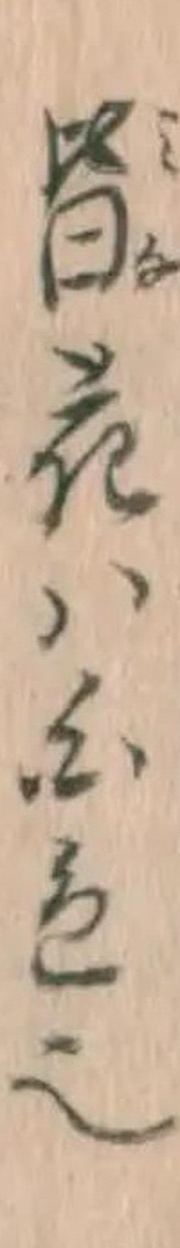皆花は白色也
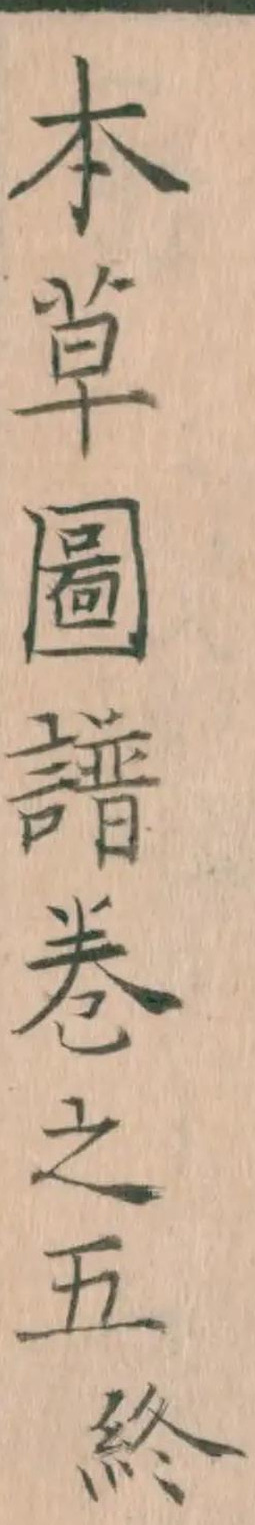本草図譜巻之五終
